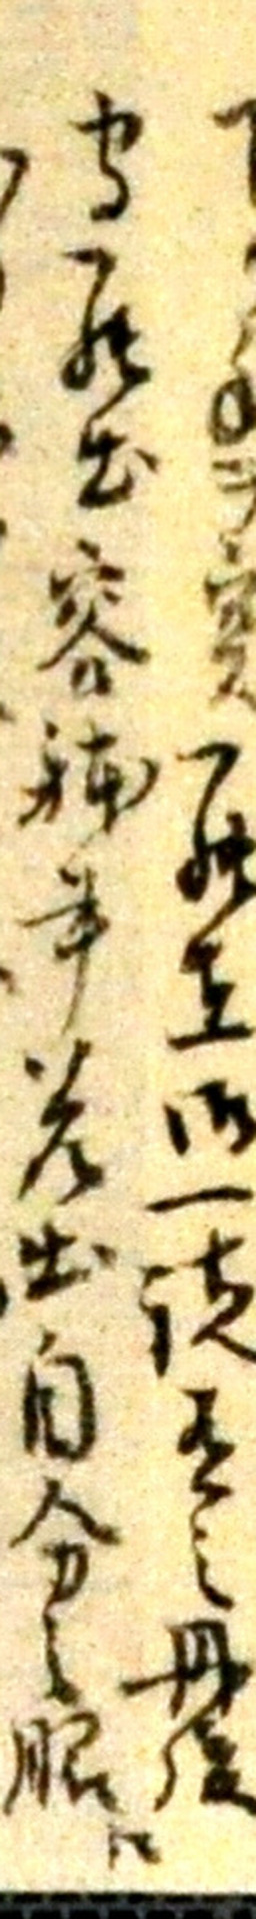守罷出容躰書差出自分之脇え
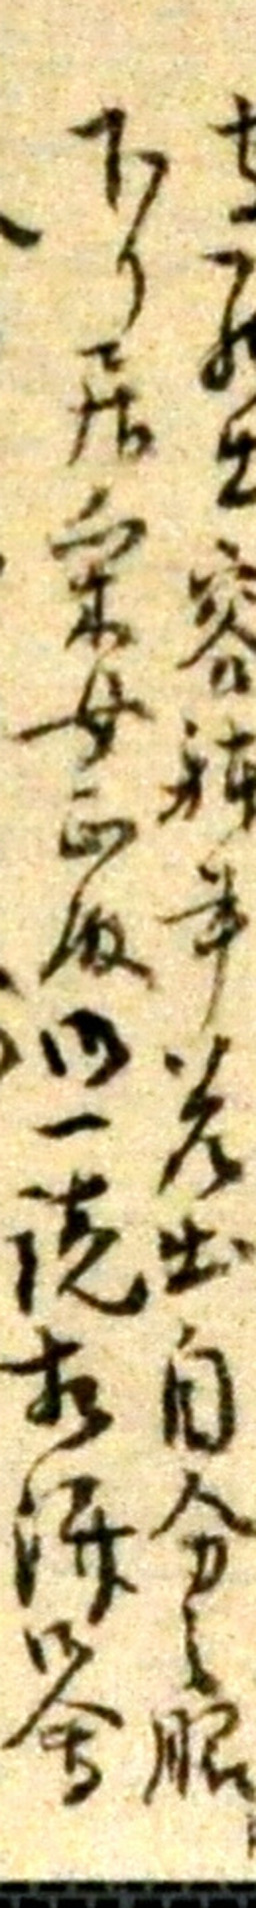下り居采女正殿御一読相済御会
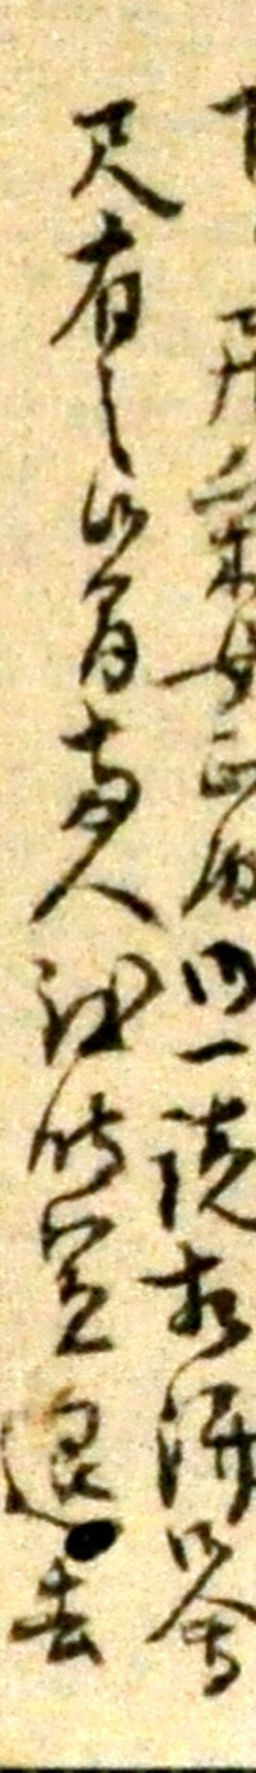尺有之候間両人致時宜退去

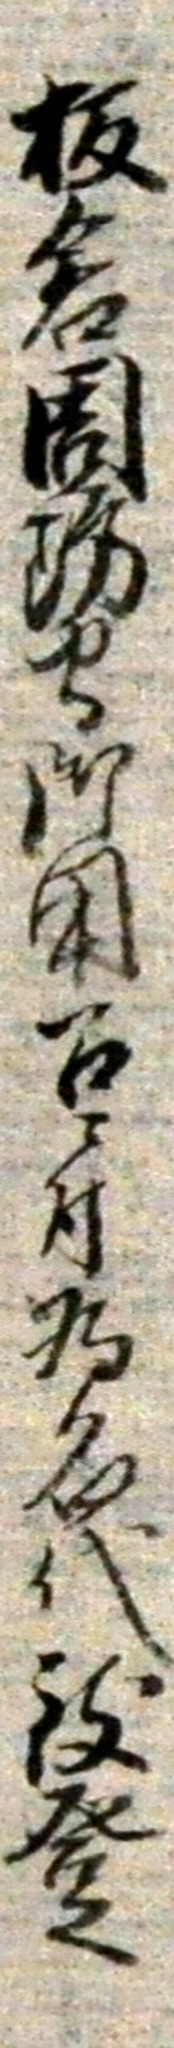板倉周防守御用召ニ付為名代致登
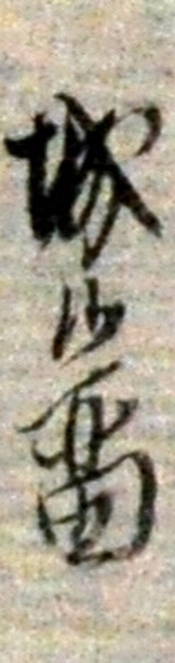城候留
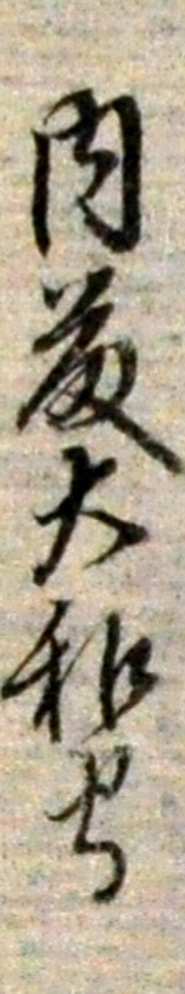内藤大和守
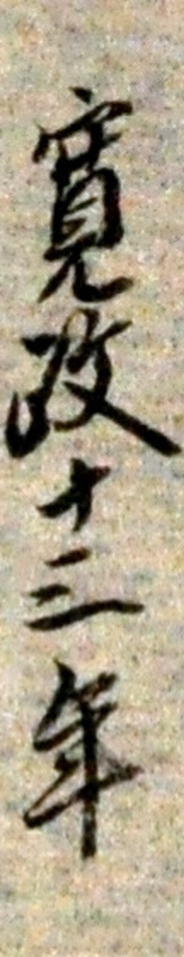寛政十三年
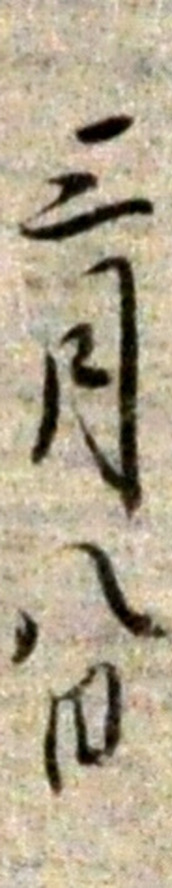三月八日
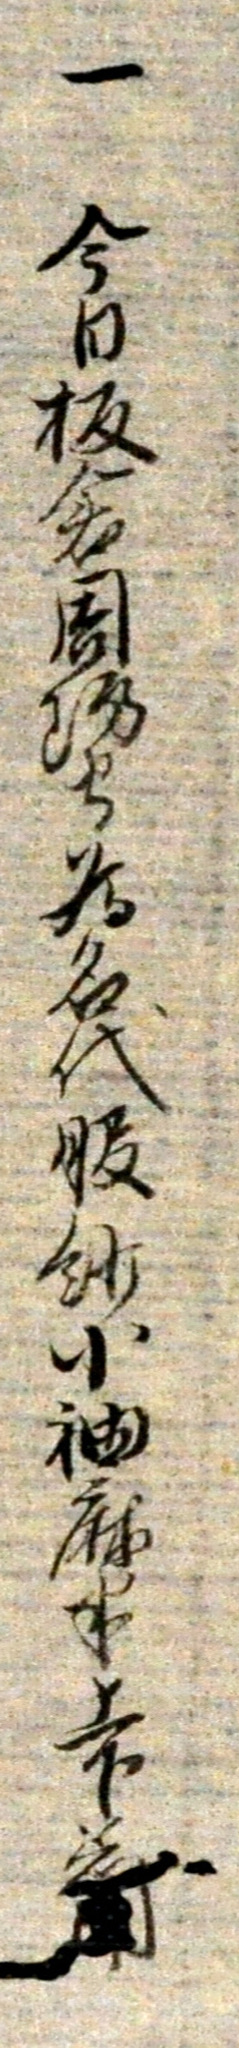一今日板倉周防守為名代服紗小袖麻半上下着用
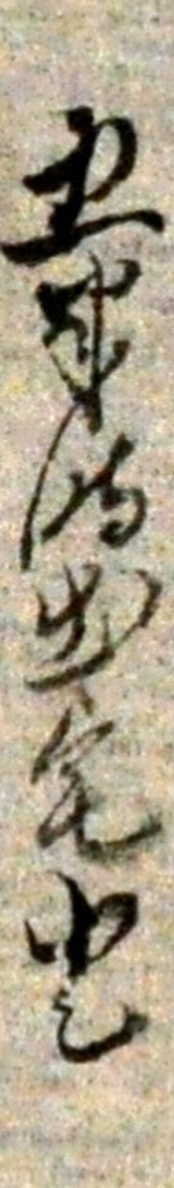五半時出宅登城
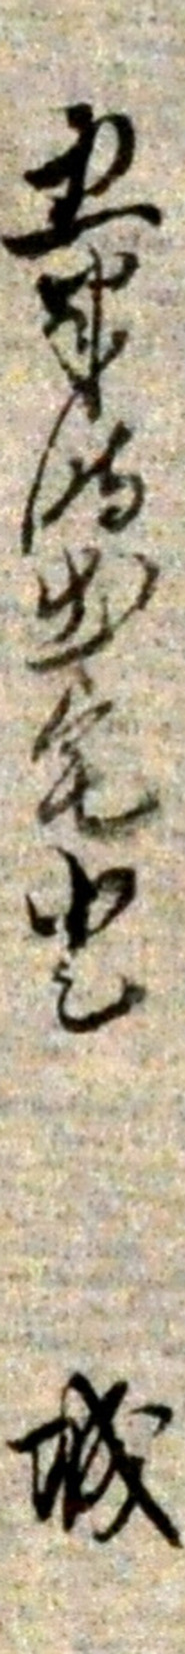五半時出宅登城
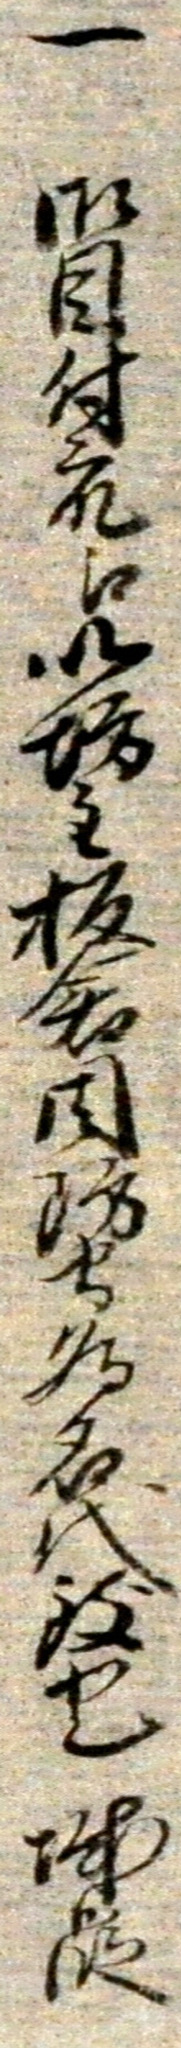一御目付衆え以坊主頂板倉周防守為名代致登城候段
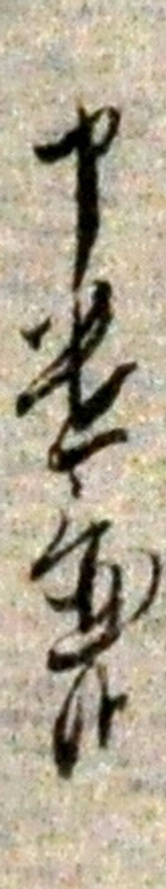申遣置候
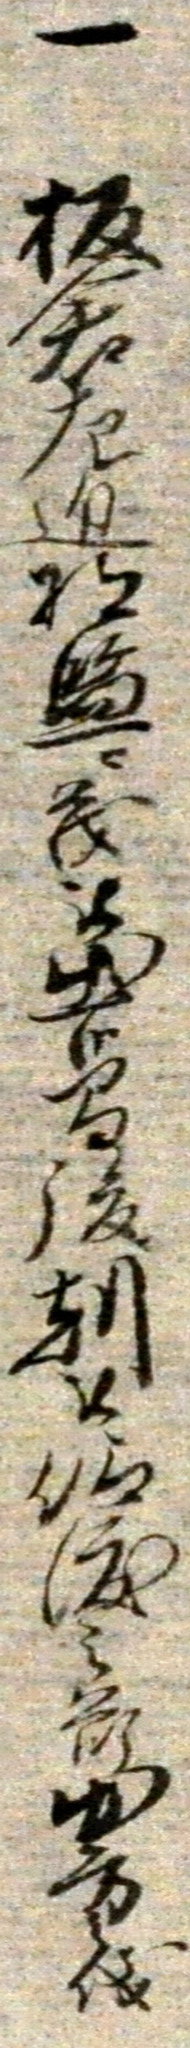一板倉左近将監にも被出候間後刻被仰渡之節出方之儀
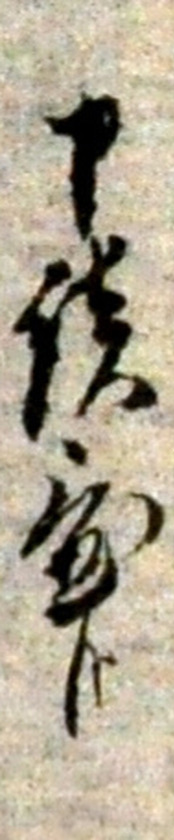申談置候
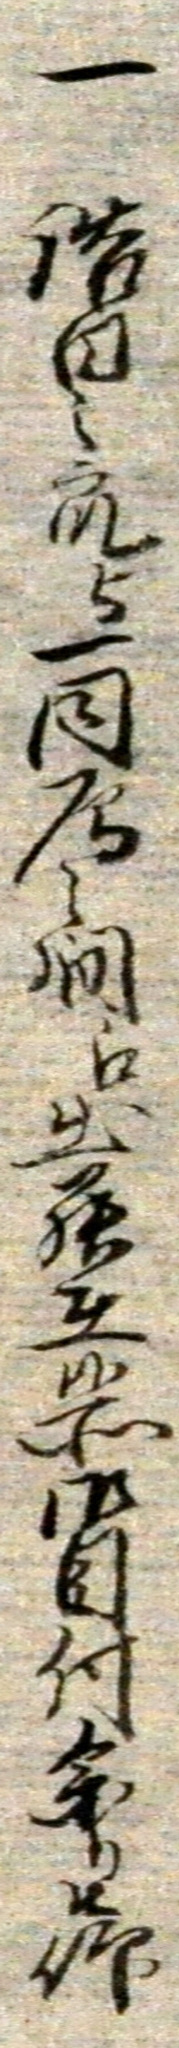一詰日之衆と一同雁之間え出罷在候所御目付参り被仰
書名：諸名代相勤候節ノ留書外
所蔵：伊那市立高遠町図書館・合同会社AMANE
